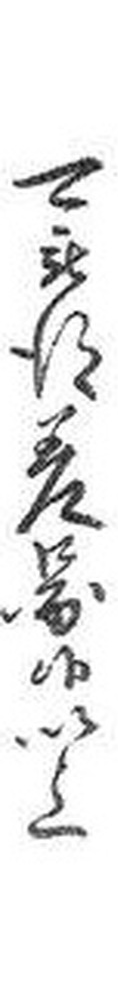可被得差図候以上
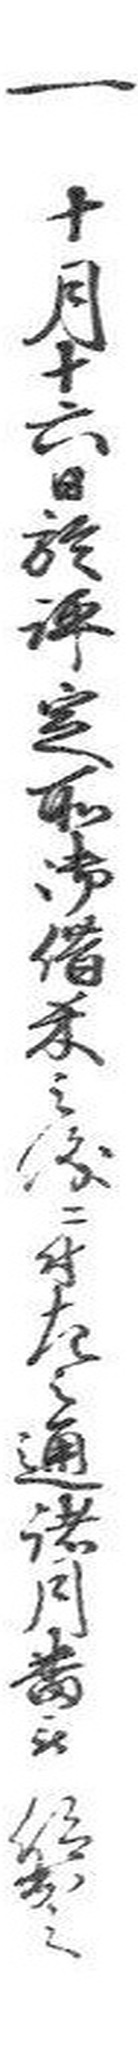一十月十六日於評定所御借米之儀ニ付左之通諸月番被仰出之
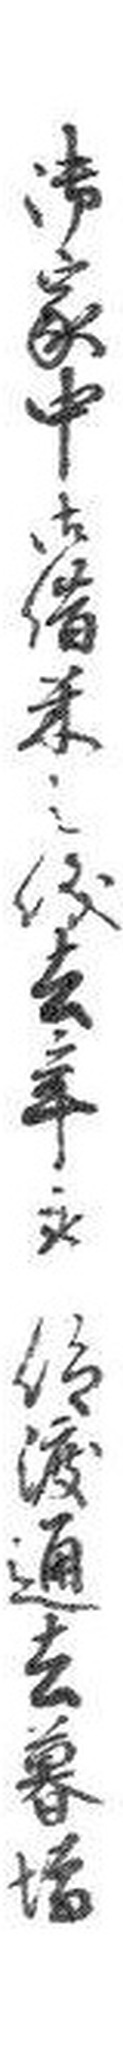御家中御借米之儀去年被仰渡通去暮増
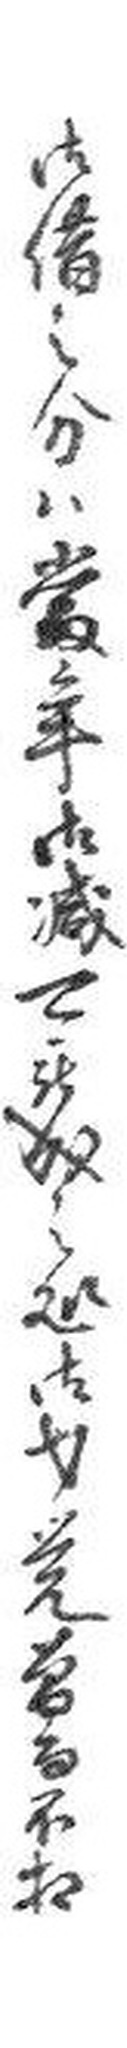御借之分は当年御減可被成之処御才覚曽而不相
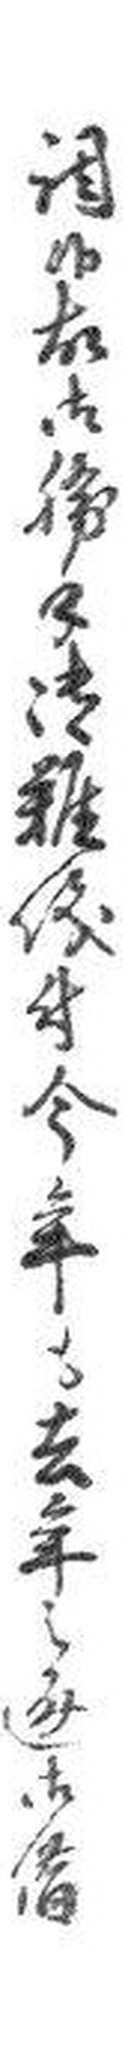調候故御勝手御難儀付今年も去年之通御借
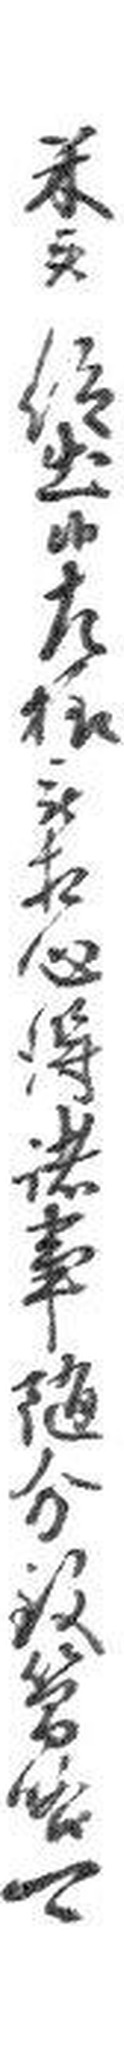米被仰出候左様被相心得諸事随分致簡略可
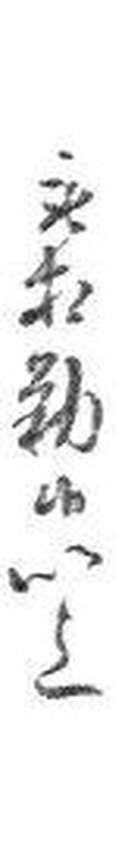被相勤候以上
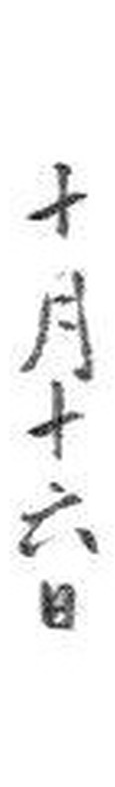十月十六日
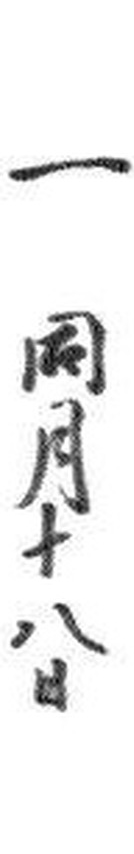一同月十八日
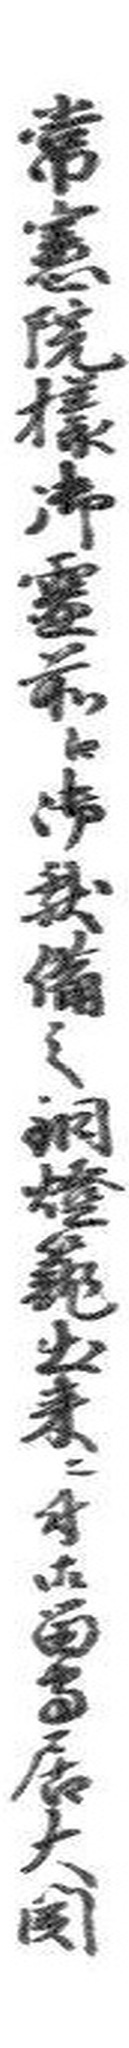常憲院様御霊前江御献備之銅燈籠出来ニ付御留守居大関
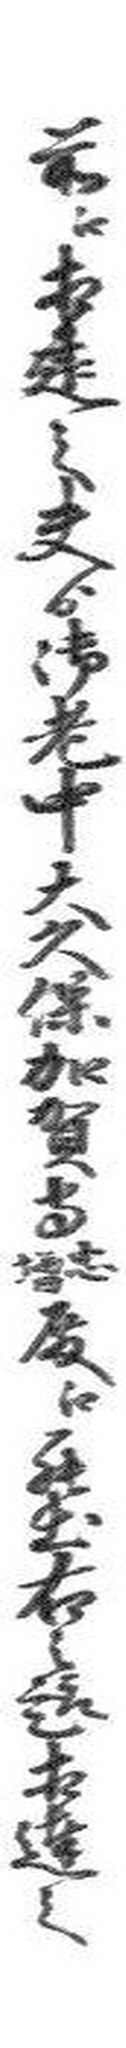前江相建之夫ゟ御老中大久保加賀守忠増殿江罷出右之趣相達之
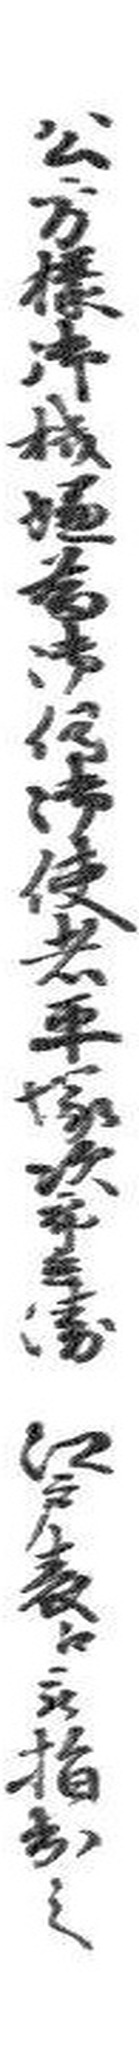公方様御機嫌為御伺御使者平塚次郎兵衛江戸表江被指出之
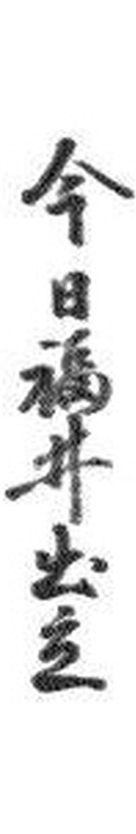今日福井出立
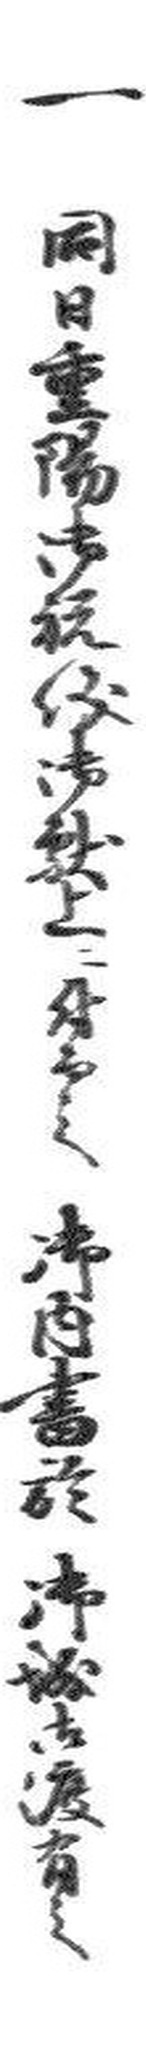一同日重陽御祝儀御献上ニ付而之御内書於御城御渡有之

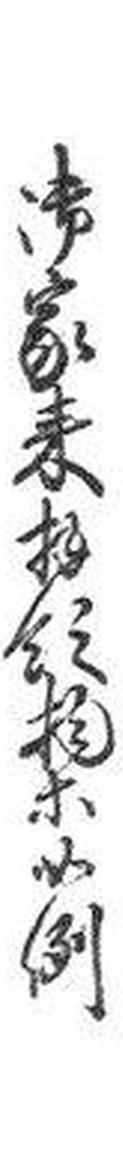御家来拝領物等如例
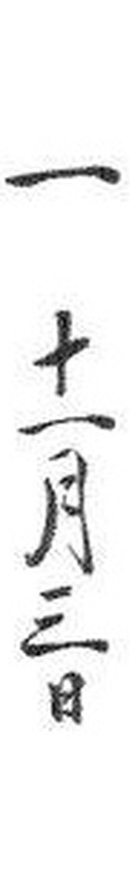一十一月三日
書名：家譜 二十五 吉品公 従宝永六年到同七年
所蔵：福井県文書館 Fukui Prefectural Archives
